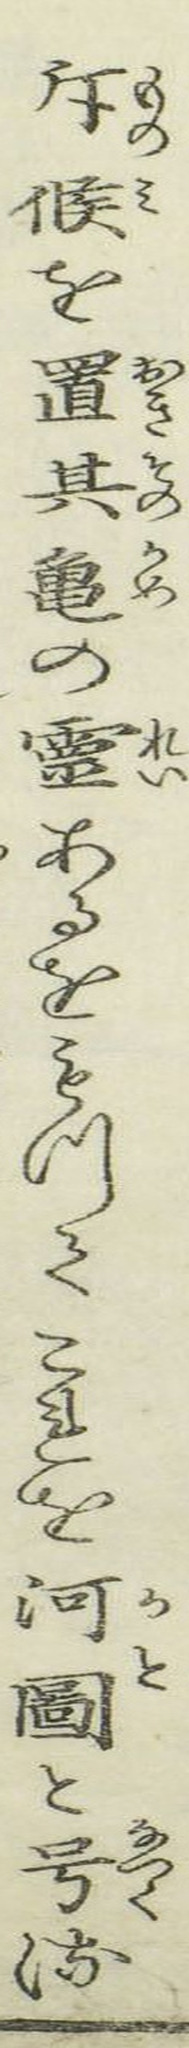斥候を置其亀の霊あるをもつてこれを河圖と号る
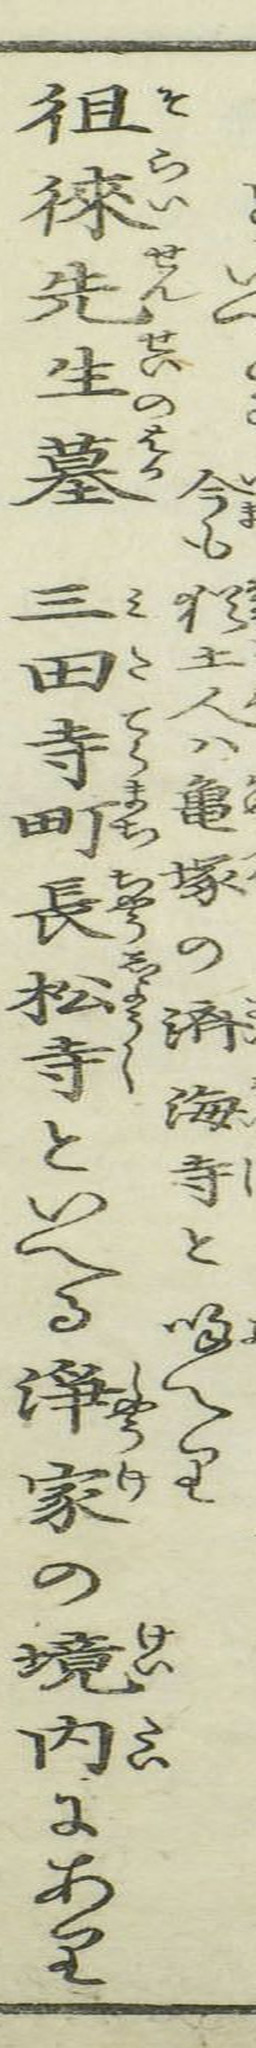徂徠先生墓三田寺町長松寺といへる浄家の境内にあり

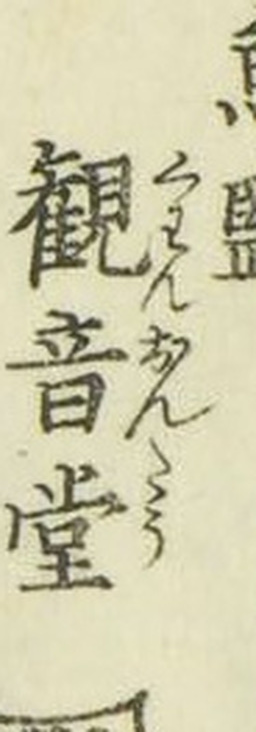観音堂

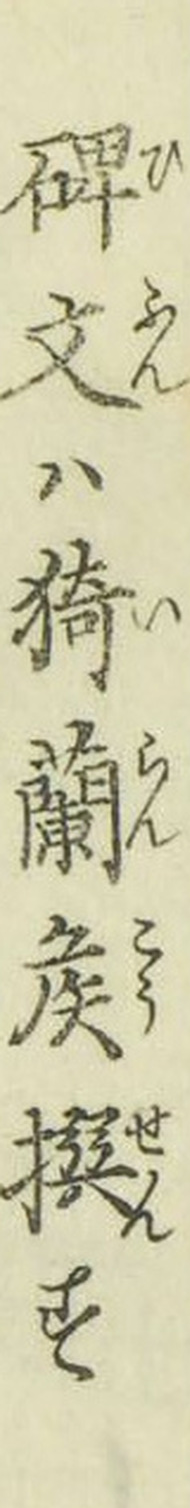碑文は猗蘭侯撰す
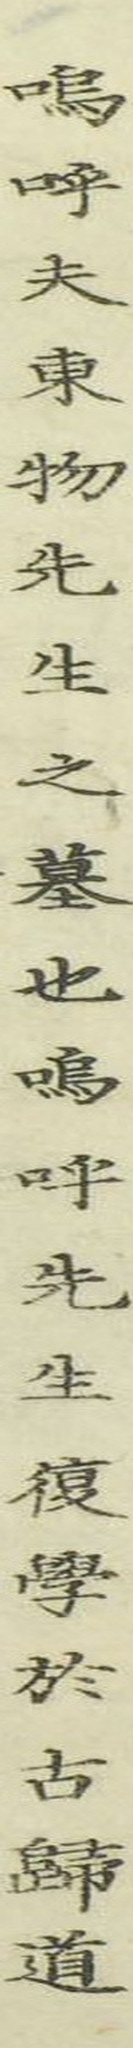嗚呼夫東物先生之墓也嗚呼先生復學於古歸道
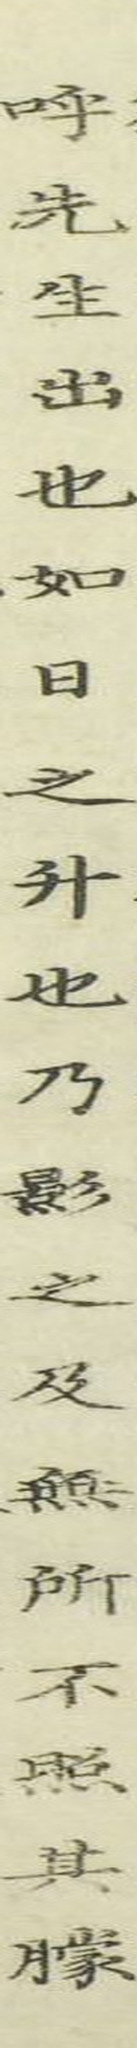呼先生出也如日之升也乃影之及無所不照其朦
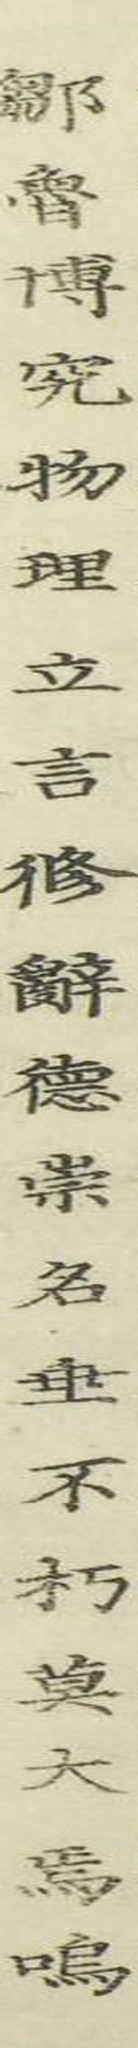鄒魯博究物理立言修辭徳崇名垂不朽莫大焉嗚
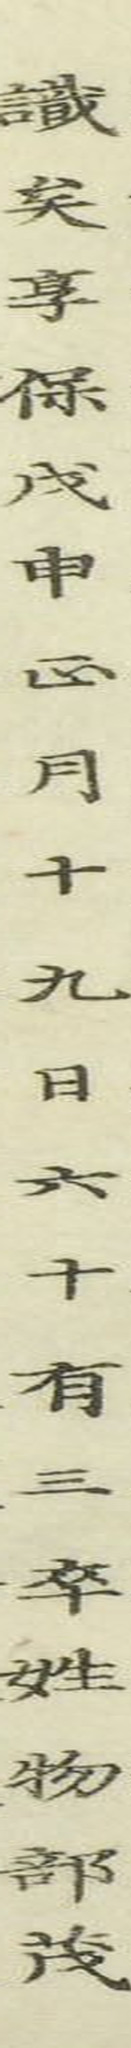識矣享保戊申正月十九日六十有三卒姓物部茂
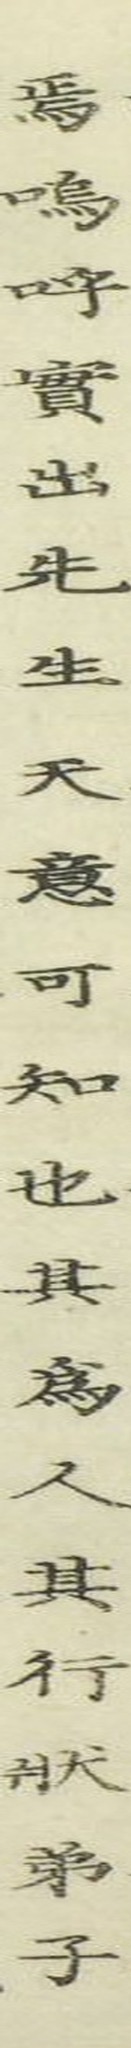焉嗚呼實出先生天意可知也其為人其行状弟子
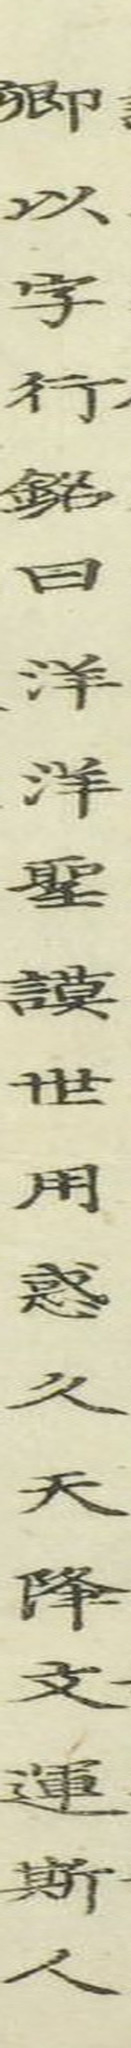卿以字行銘曰洋洋聖謨世用惑久天降文運斯人
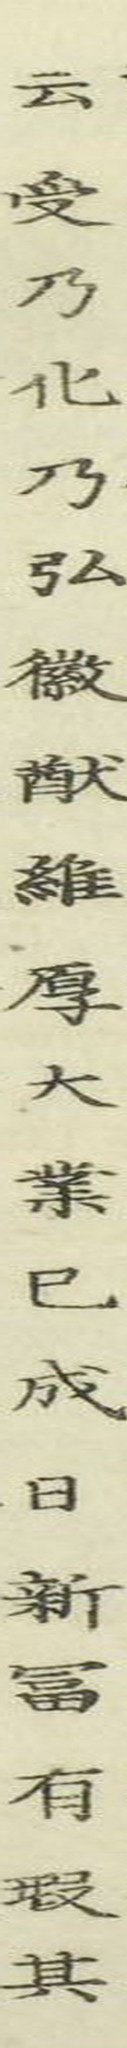云受乃化乃弘徽猷維厚大業巳成日新冨有瑕其
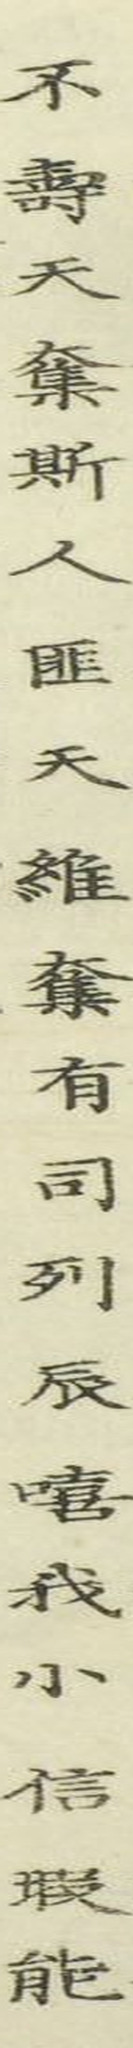不壽天奪斯人匪天維奪有司列辰嘻我小信瑕能
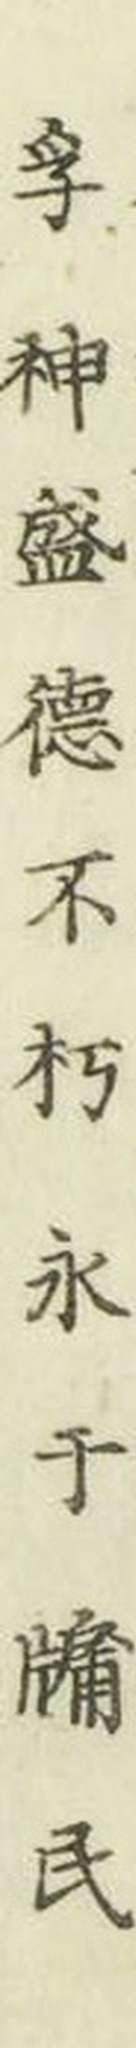孚神盛徳不朽永于牖民
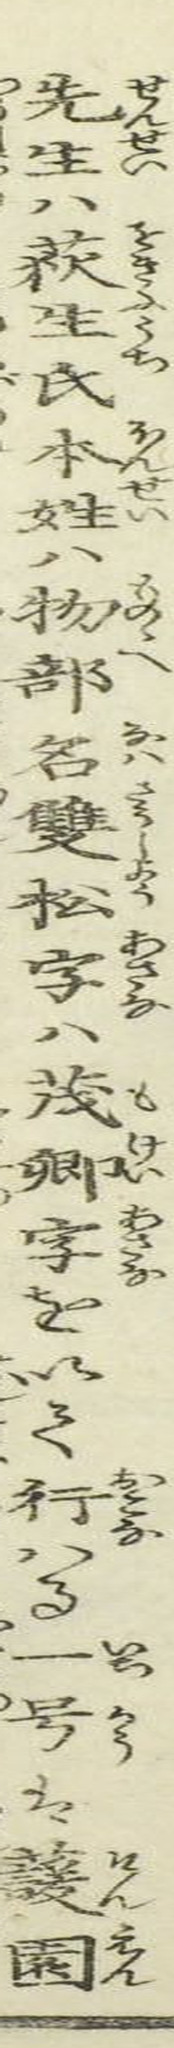先生は荻生氏本姓は物部名雙松字は茂卿字を以て行はる一号は蘐園
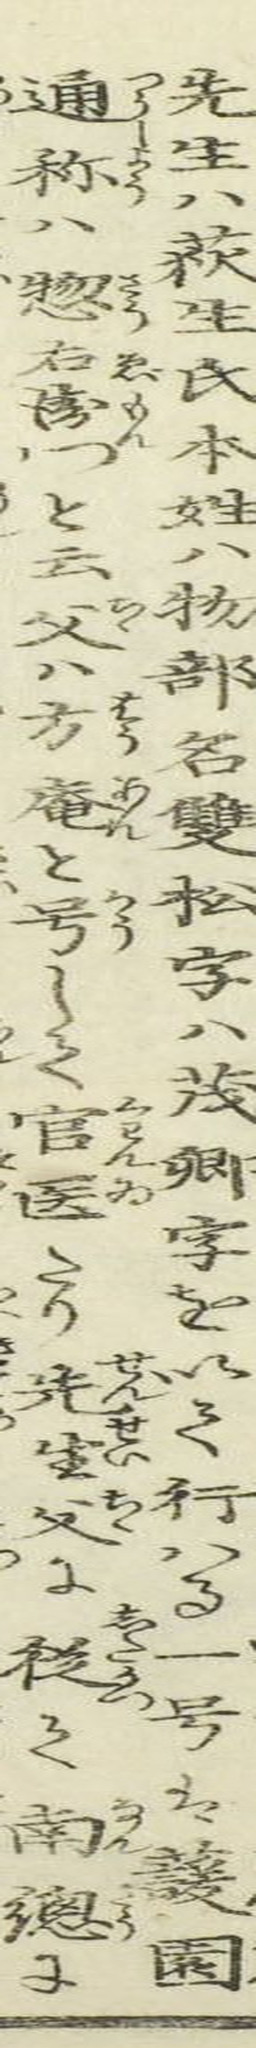通称は惣右衛門と云父は方庵と号して官医たり先生父に従て南総に
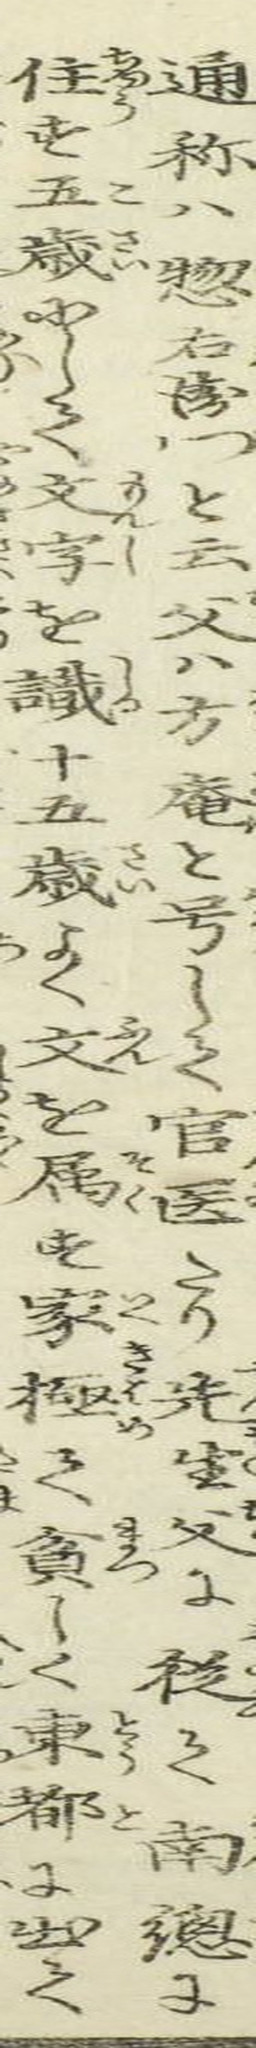住す五歳にして文字を識十五歳よく文を属す家極て貧しく東都に出て
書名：江戸名所図会 20巻 巻之3
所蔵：東京学芸大学教育コンテンツアーカイブ
